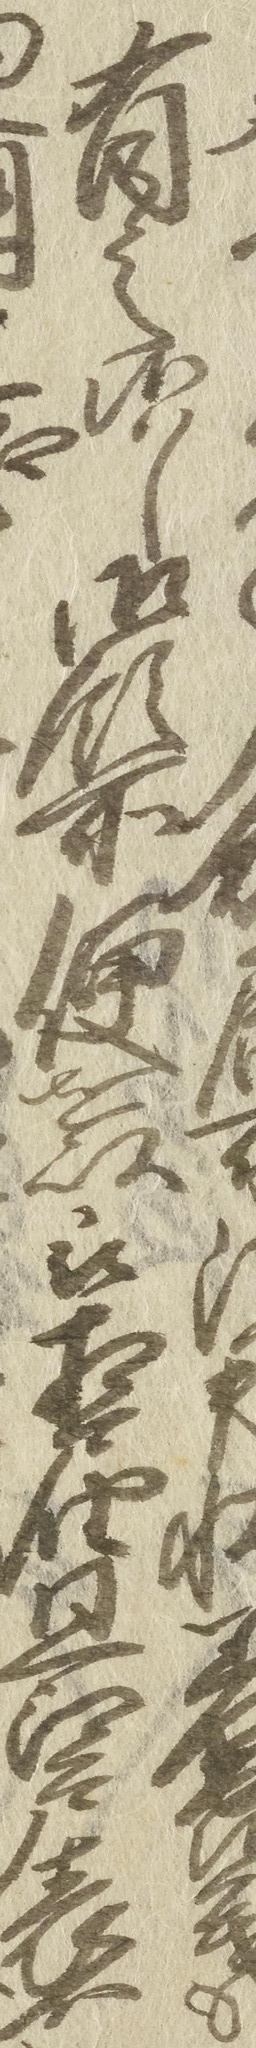有之候ハゝ御暦所便を以被相届且江戸表ゟ
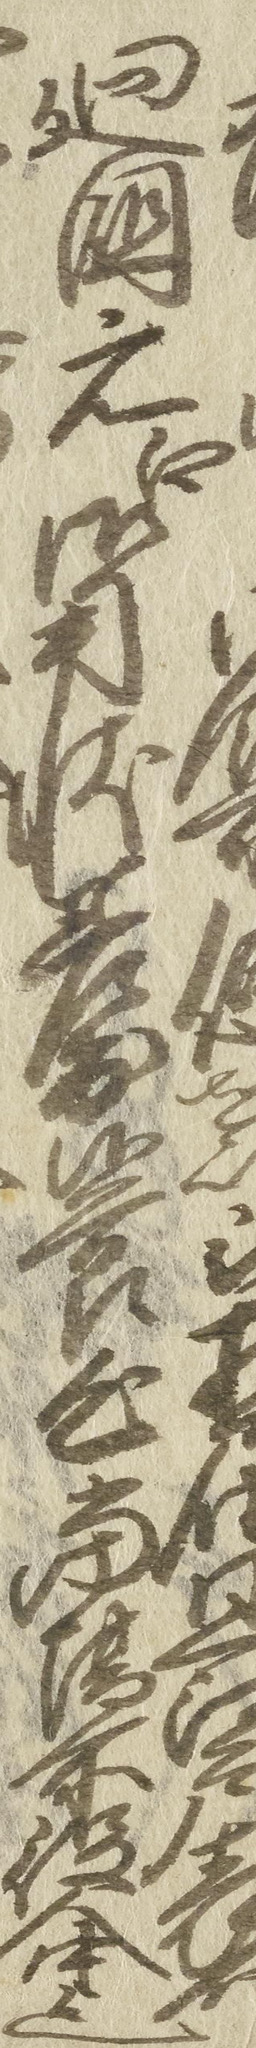廻国元江御用状差出候節心当場所役人中迄
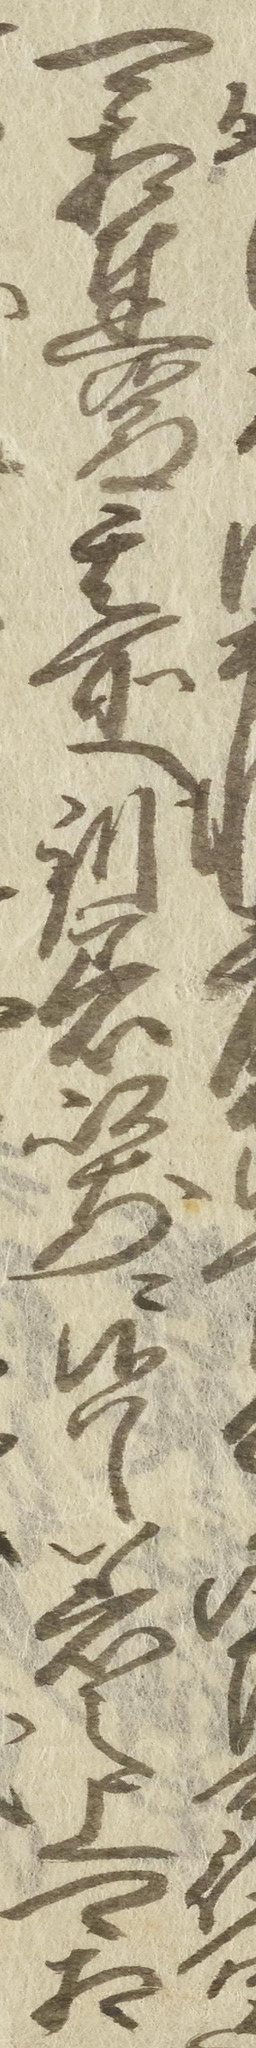可相達候間其所へ到着以前ニ候ハゝ着之上可相
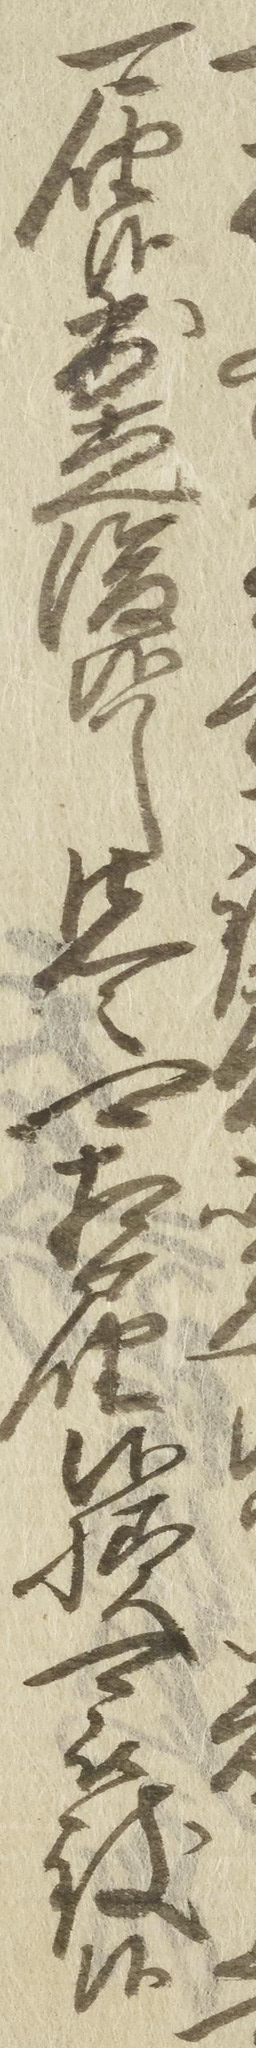届候出立後候ハゝ先々可相届候様可被致候
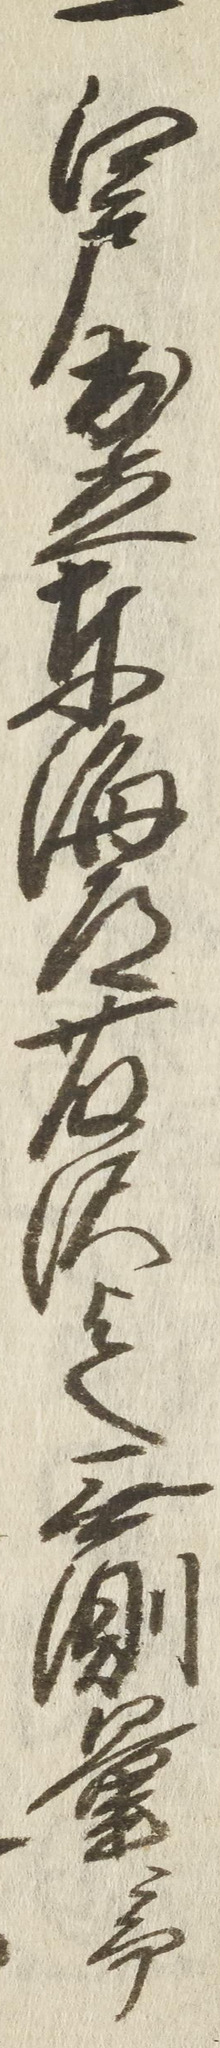一江戸出立東海道藤沢迄無測量ニ而
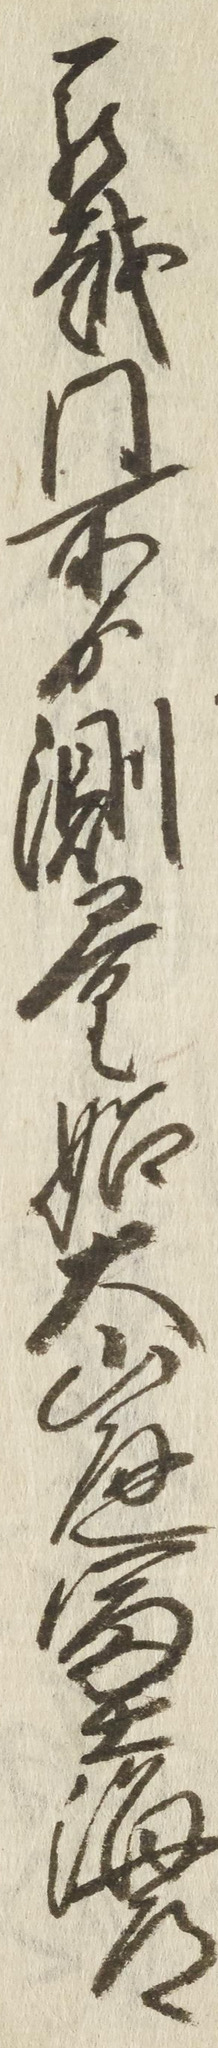罷越同所ゟ測量始大山通富士海道
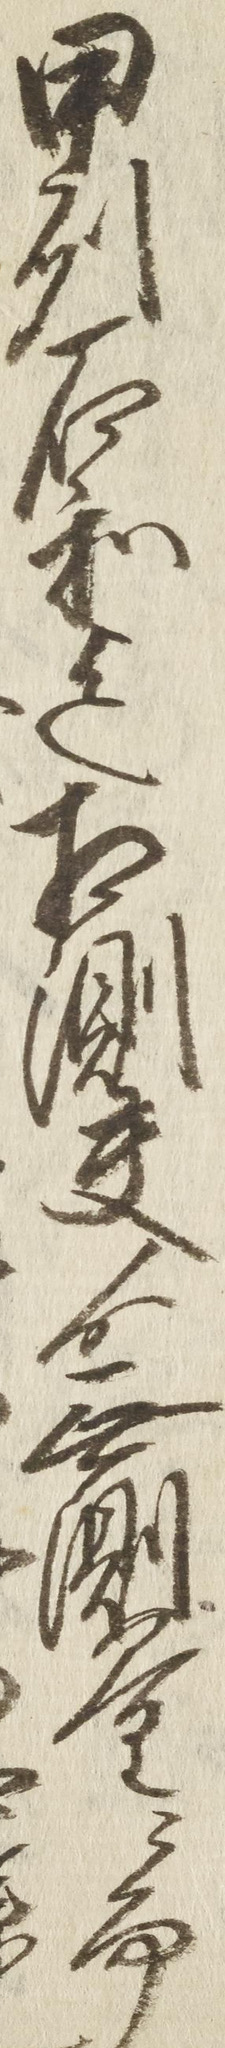甲州石和迄相測夫ゟ無測量ニ而
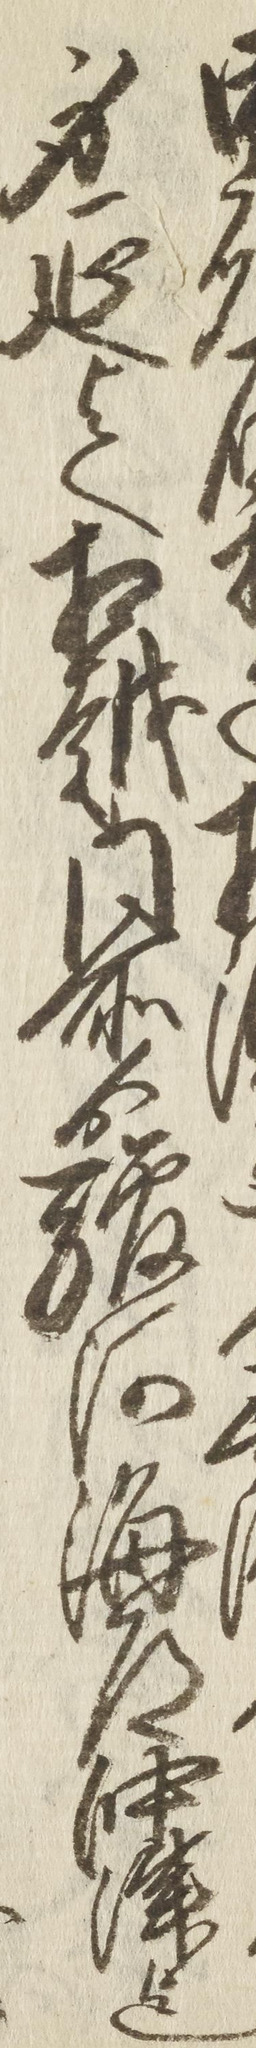身延迄相越同所ゟ駿河海道仲津迄
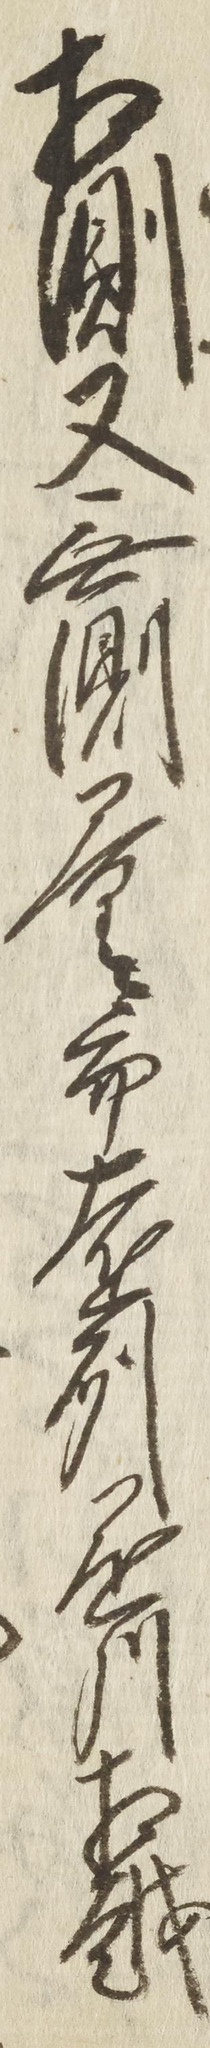相測又無測量ニ而遠州懸川相越
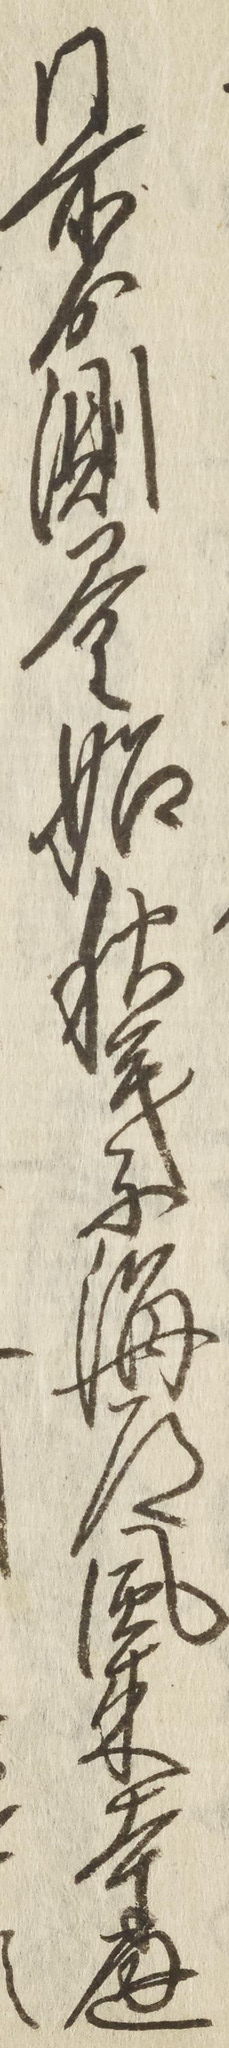同所ゟ測量始秋葉海道鳳来寺通
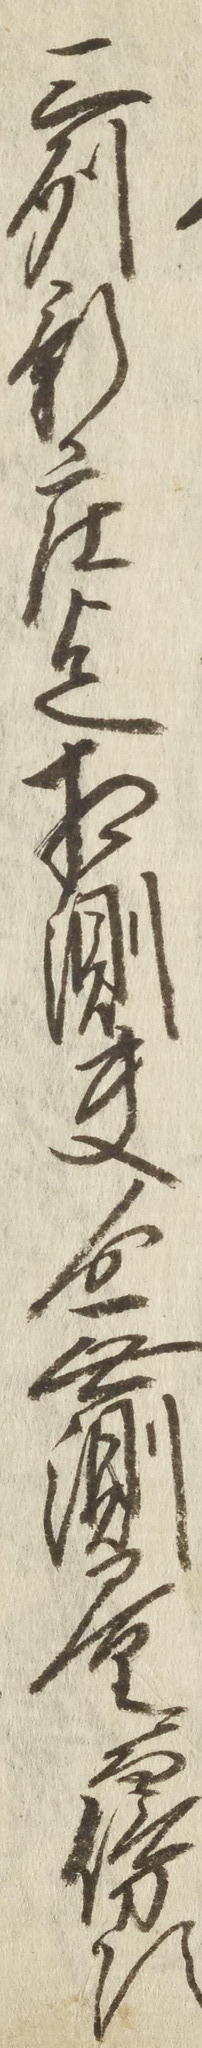三州新庄迄相測夫ゟ無測量ニ而信州

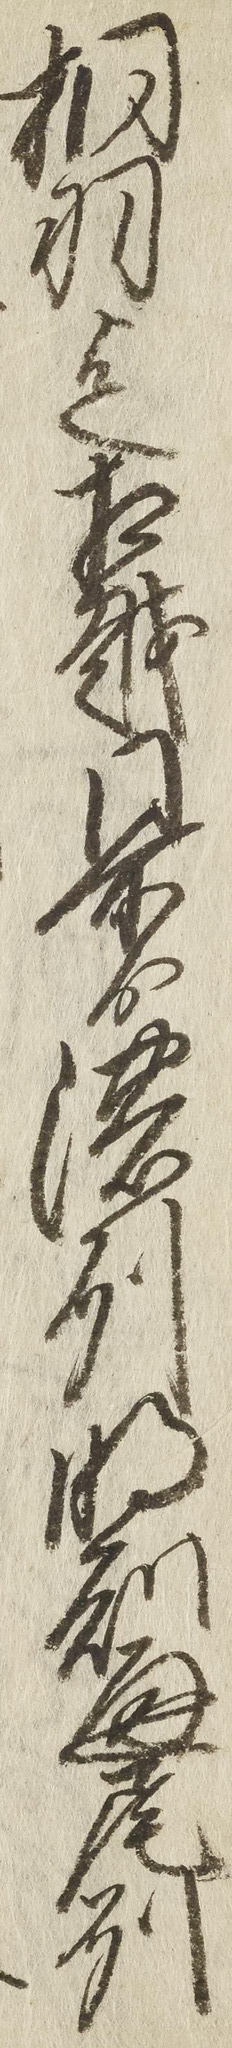相羽迄相越同所ゟ濃州明知通尾州
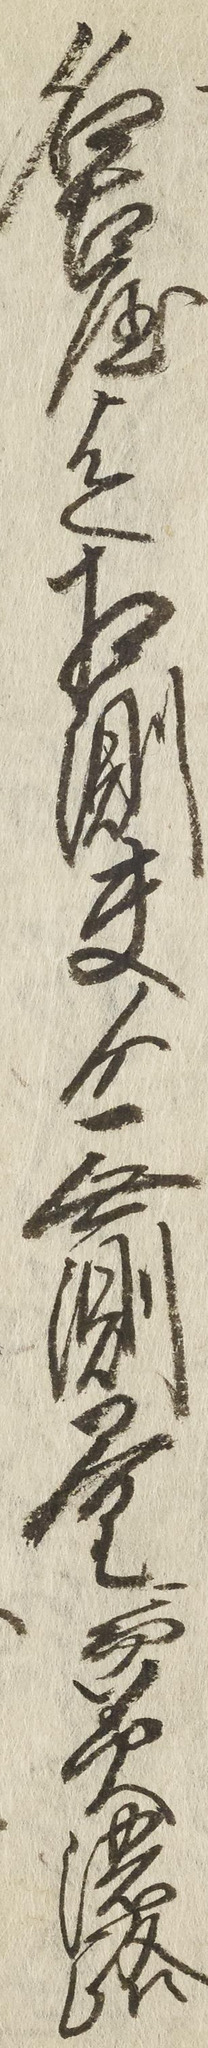名古屋迄相測夫ゟ無測量ニ而美濃路
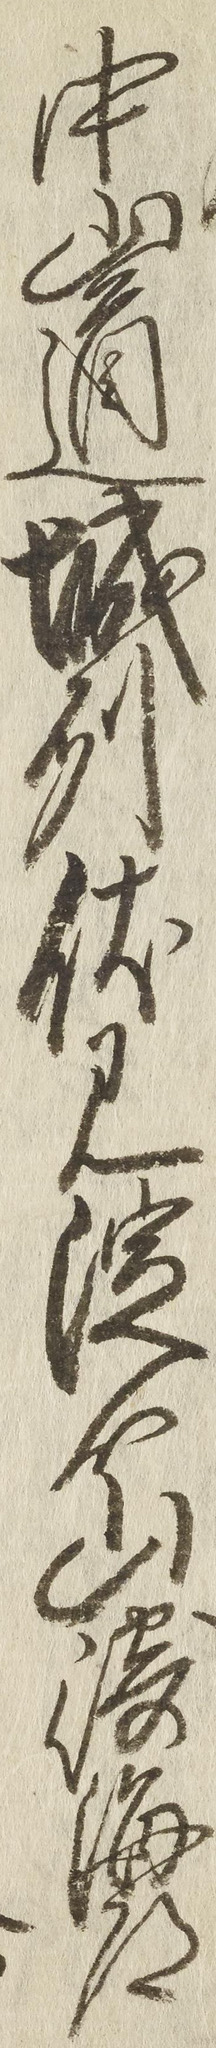中山道城州伏見淀ゟ山崎海道
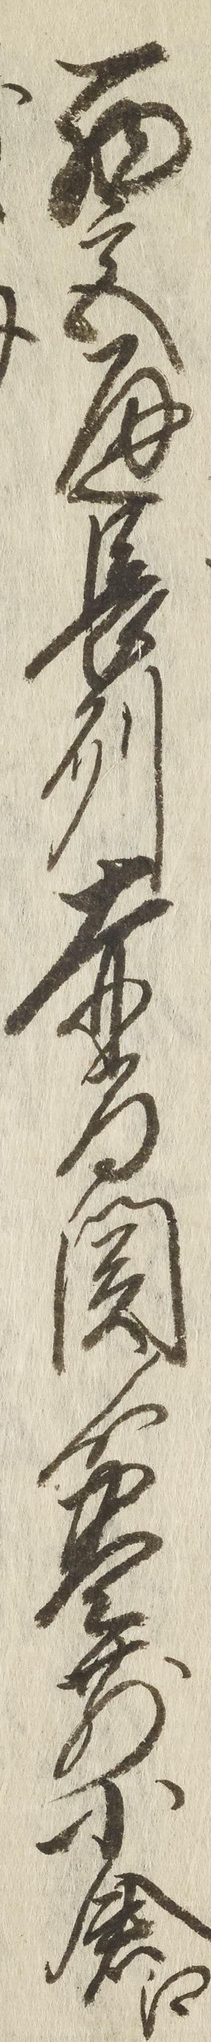西宮通長州赤間関ゟ豊前小倉江
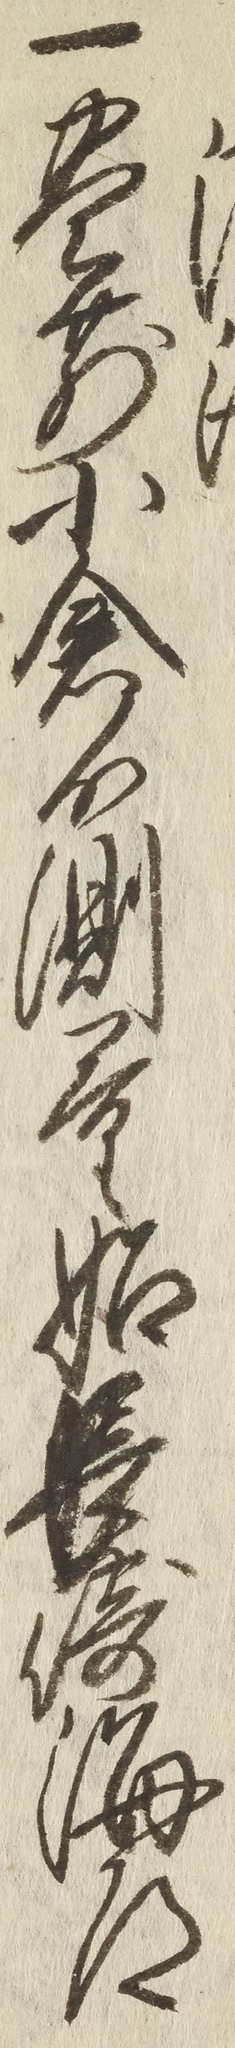一豊前小倉ゟ測量始長崎海道
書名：天文方御廻御先触写
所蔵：東京大学地震研究所図書室 Earthquake Research Institute Library, The University of Tokyo, JAPAN
